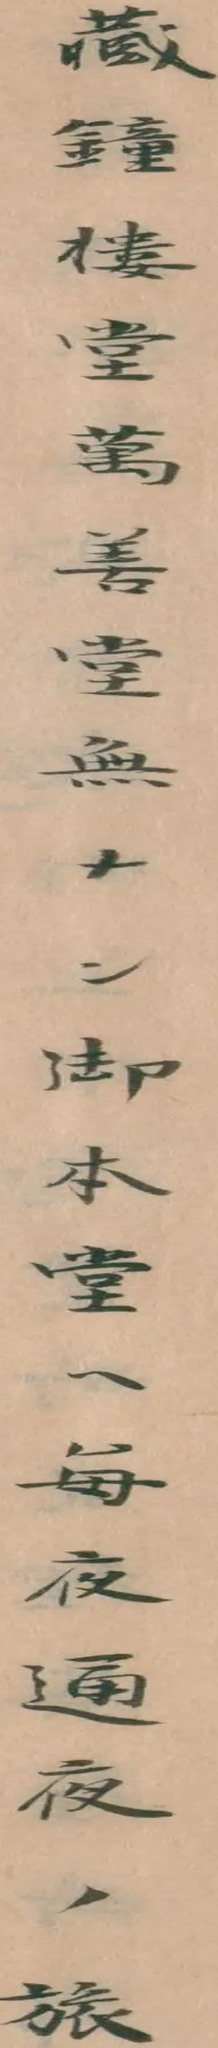藏鐘楼堂万善堂無ナン御本堂ヘ毎夜通夜ノ旅
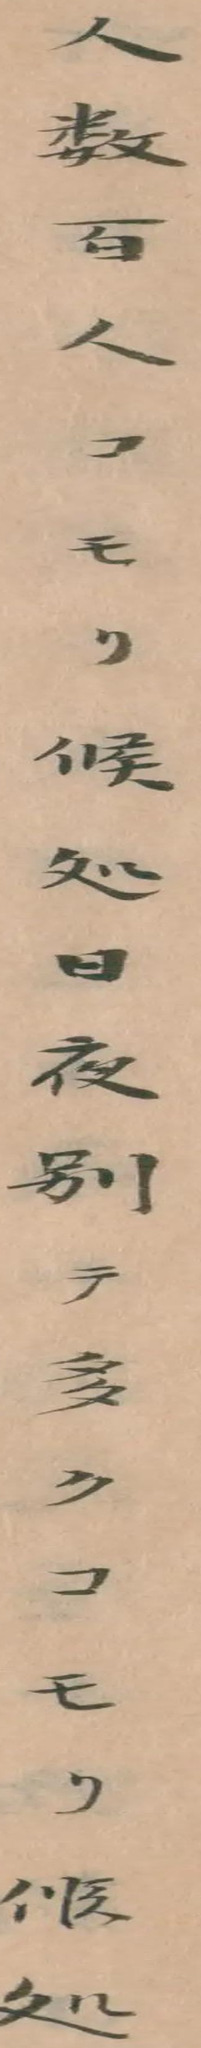人数百人コモリ候処日夜別テ多クコモリ候処
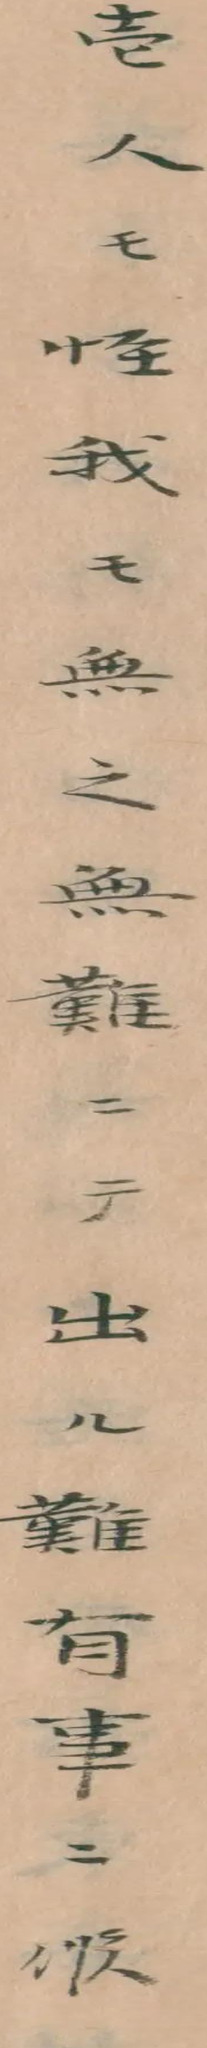壱人モ怪我モ無之無難ニテ出ル難有事ニ候
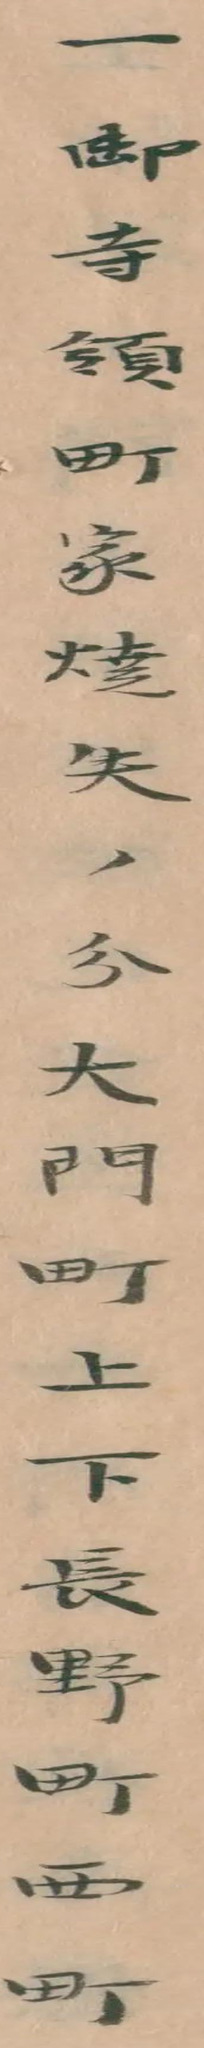一御寺領町家焼失ノ分大門町上下長野町西町

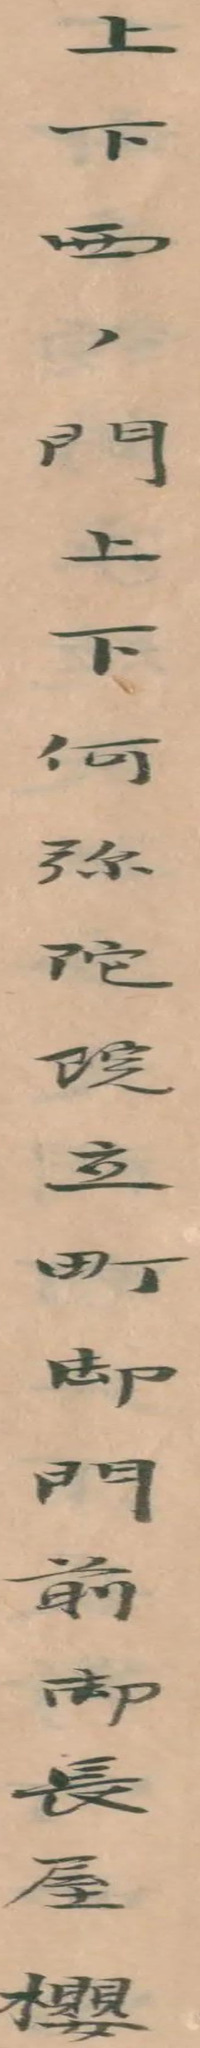上下西ノ門上下阿弥陀院立町御門前御長屋桜
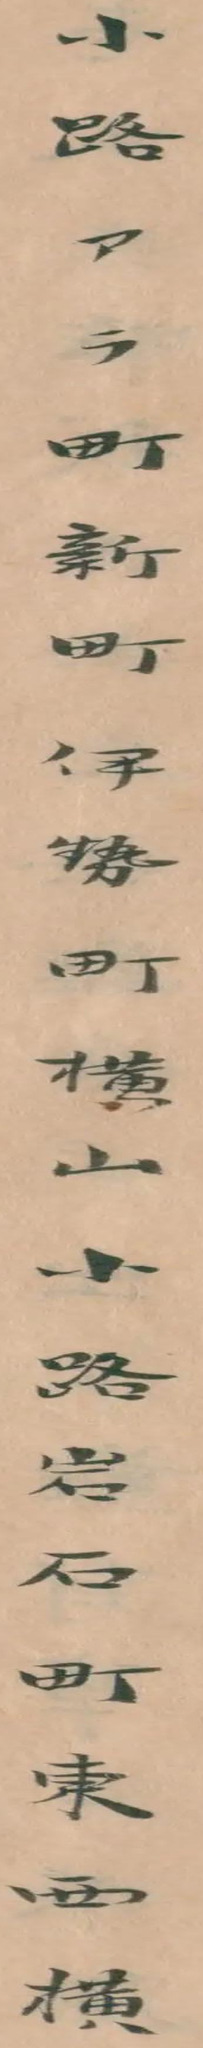小路アラ町新町伊勢町横山小路岩石町東西横
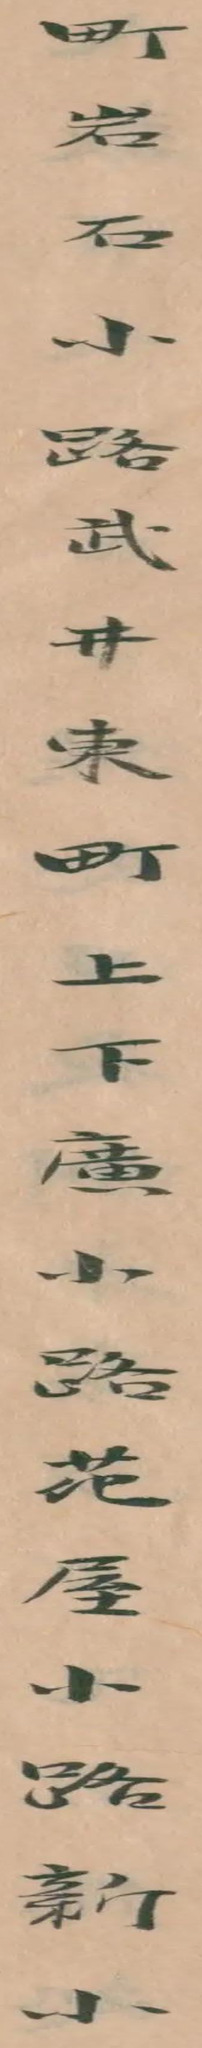町岩石小路武井東町上下広小路花屋小路新小
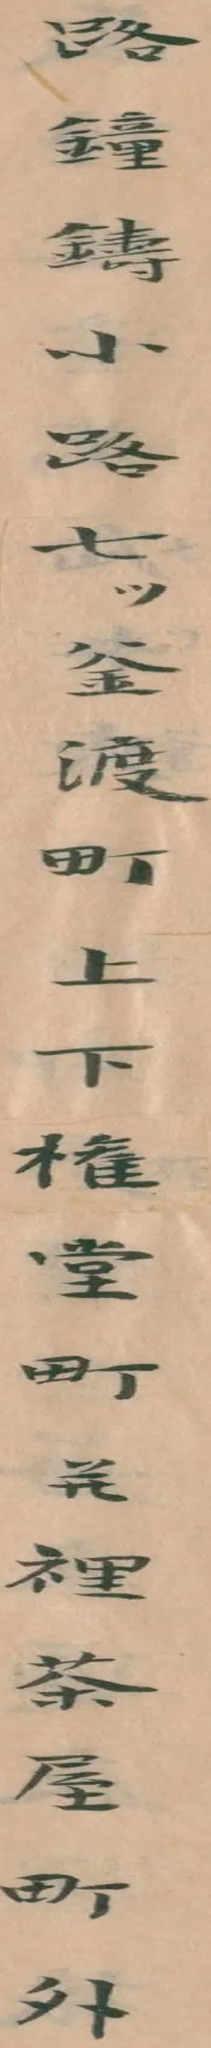路鐘鋳小路七ツ釜渡町上下権堂町并裡茶屋町外
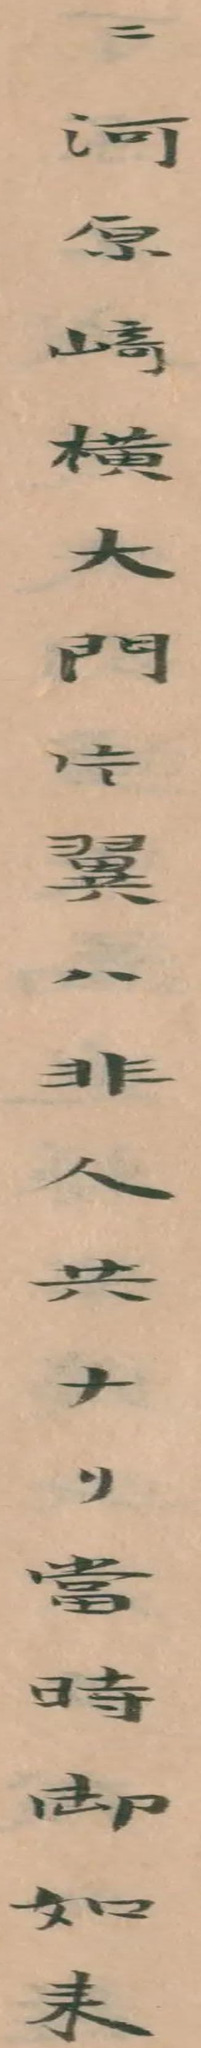ニ河原崎横大門片翼ハ非人共ナリ当時御如来
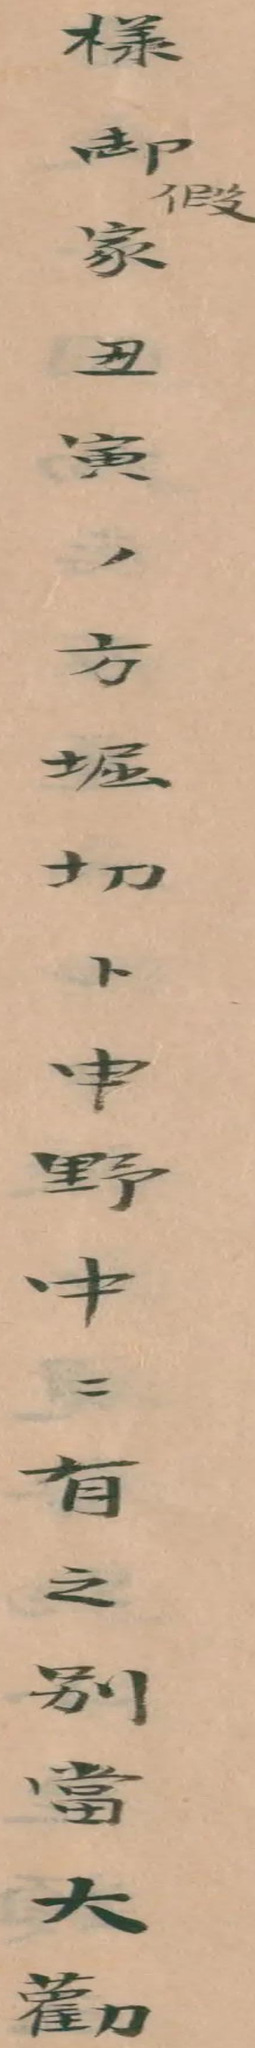様御仮家丑寅ノ方堀切ト申野中ニ有之別当大勧
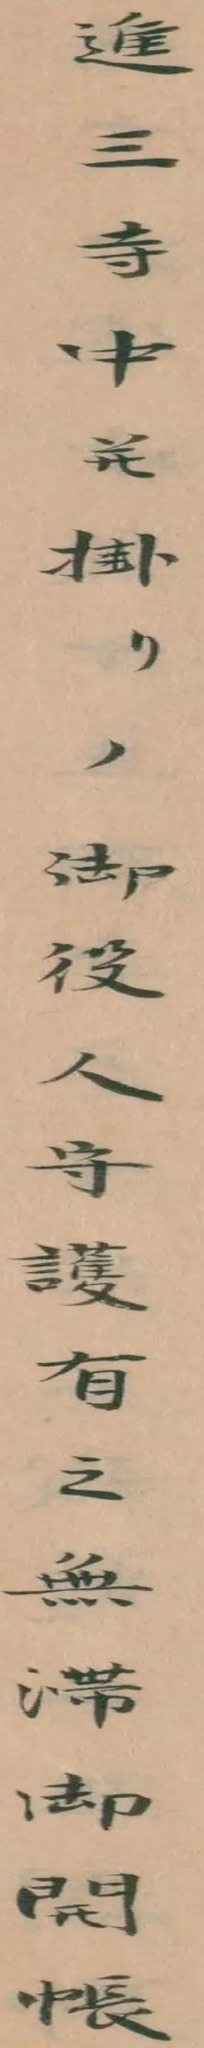進三寺中并掛リノ御役人守護有之無滞御開帳
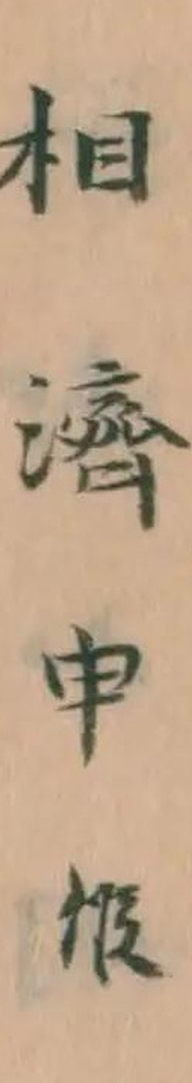相済申候
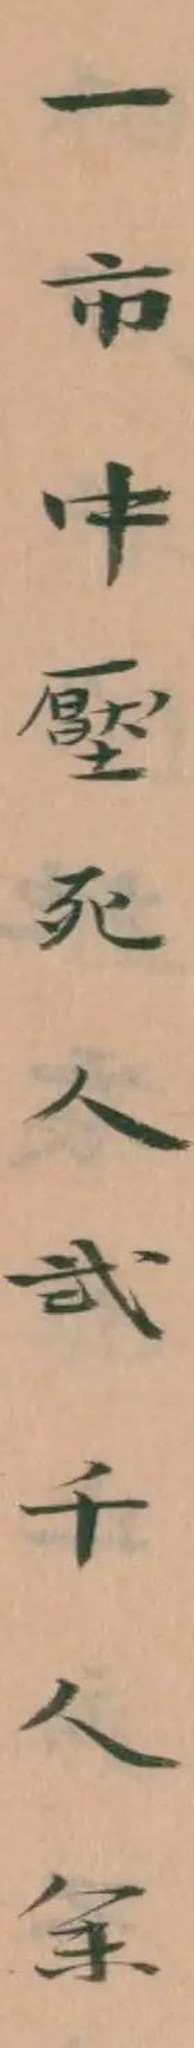一市中圧死人弐千人余
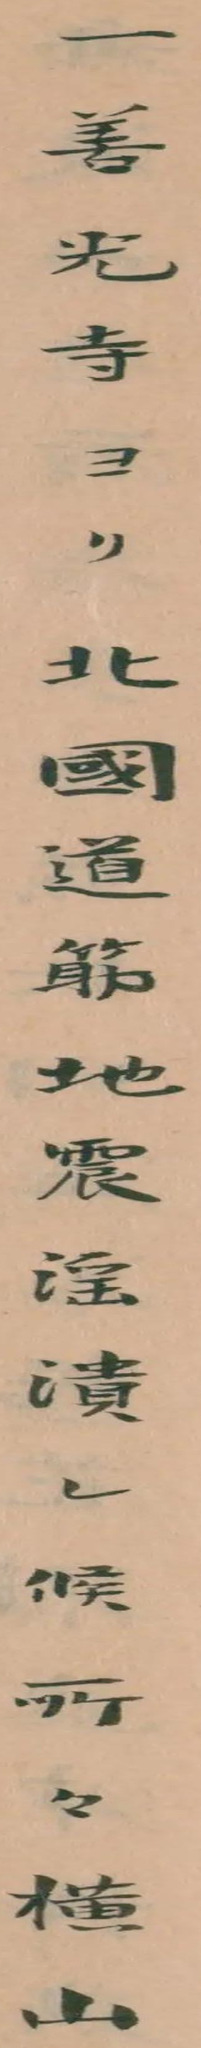一善光寺ヨリ北国道筋地震淘潰レ候所々横山
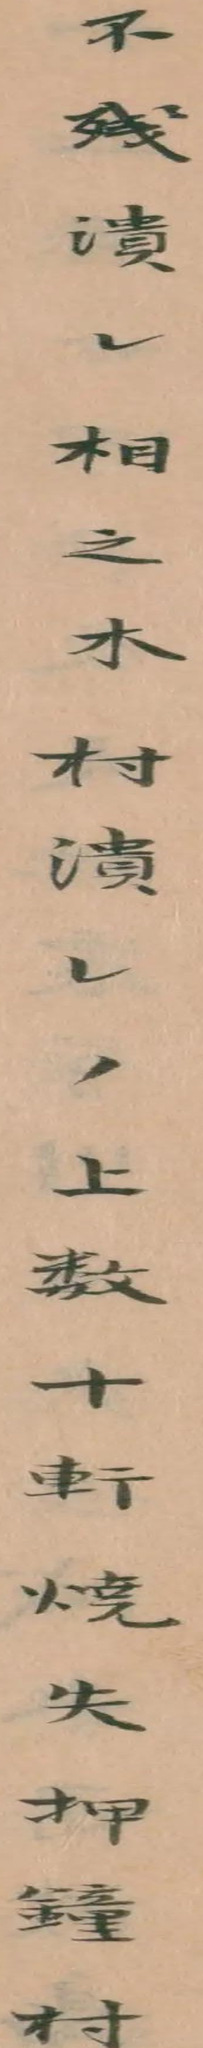不残潰レ相之木村潰レノ上数十軒焼失押鐘村
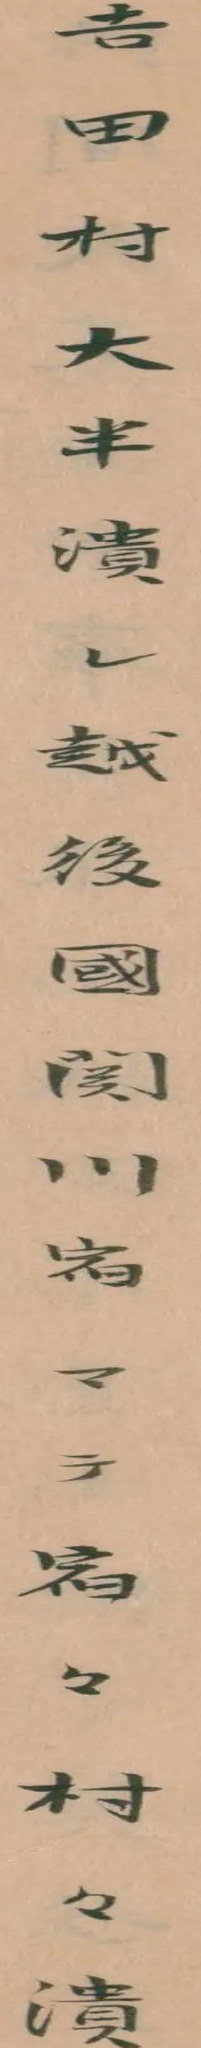吉田村大半潰レ越後国関川宿マテ宿々村々潰
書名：地災撮要. 巻5-6(地震之部)
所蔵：国立国会図書館 National Diet Library, JAPAN
